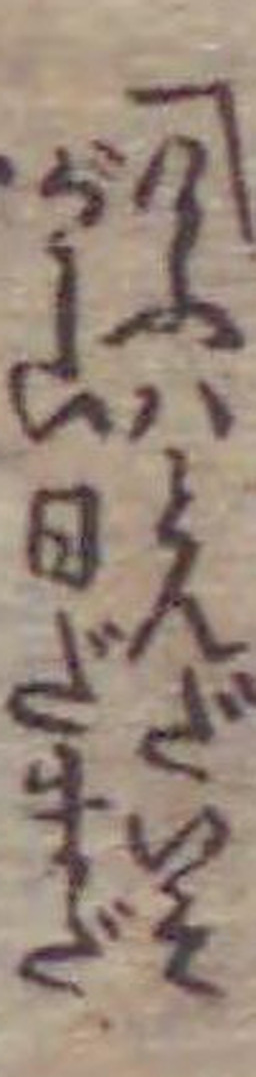がしい日だまだ
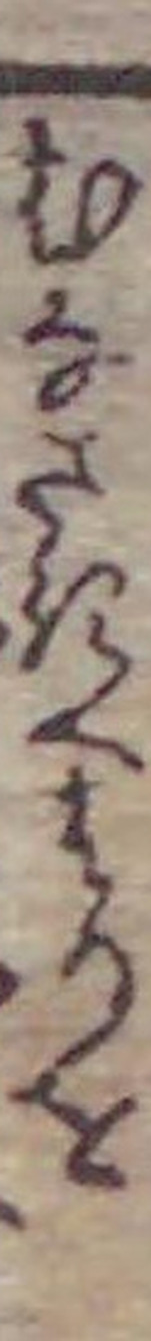むなさきへはりを
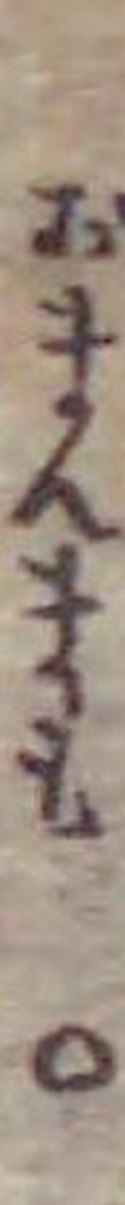おまんまも
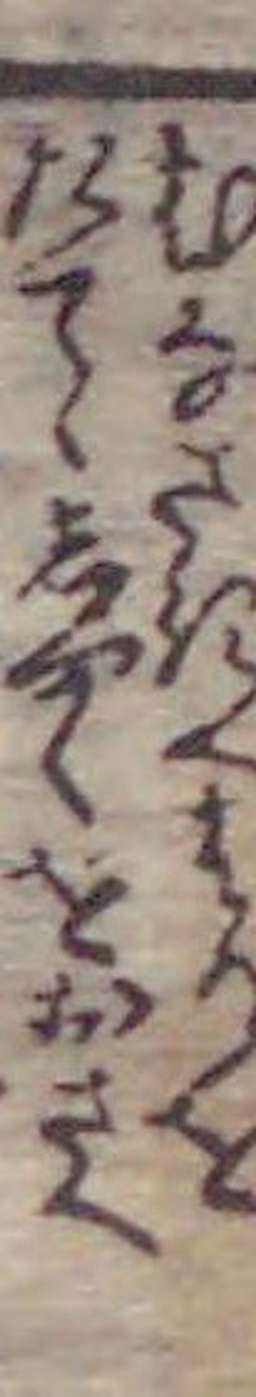たてゝしやくをおさへ
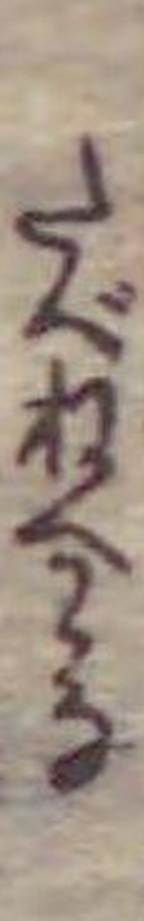たべねへわな
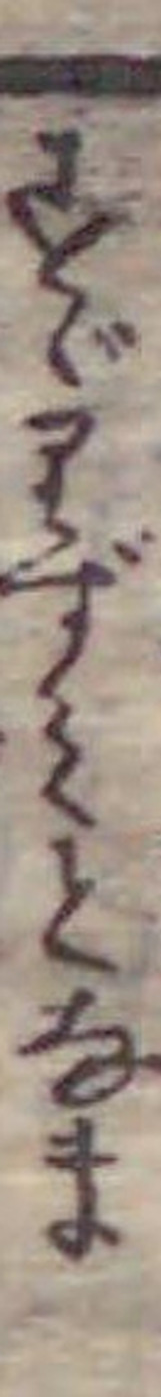すゞりずみとなま
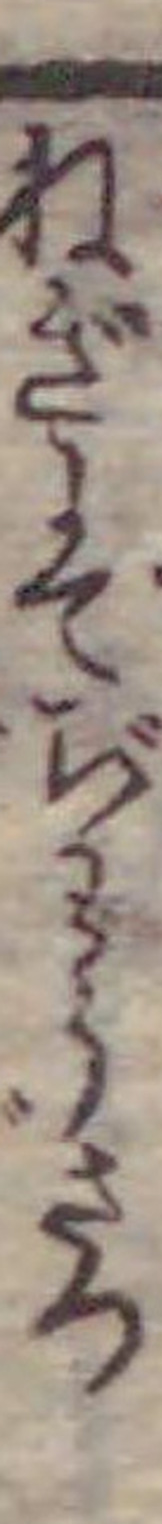ねぎにてぢわうさつ
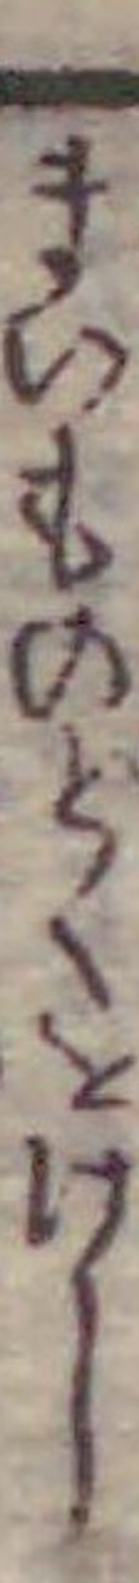まいものどくをげし
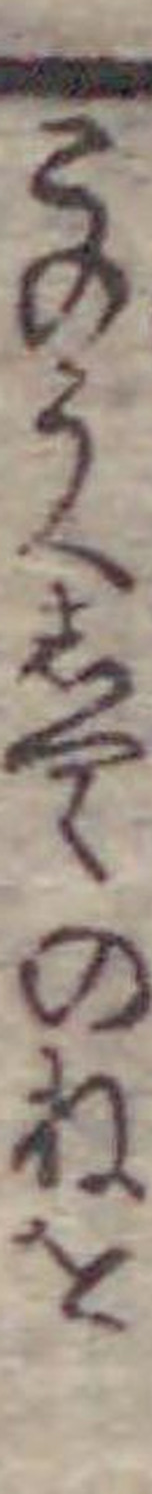このうへしやくのねを
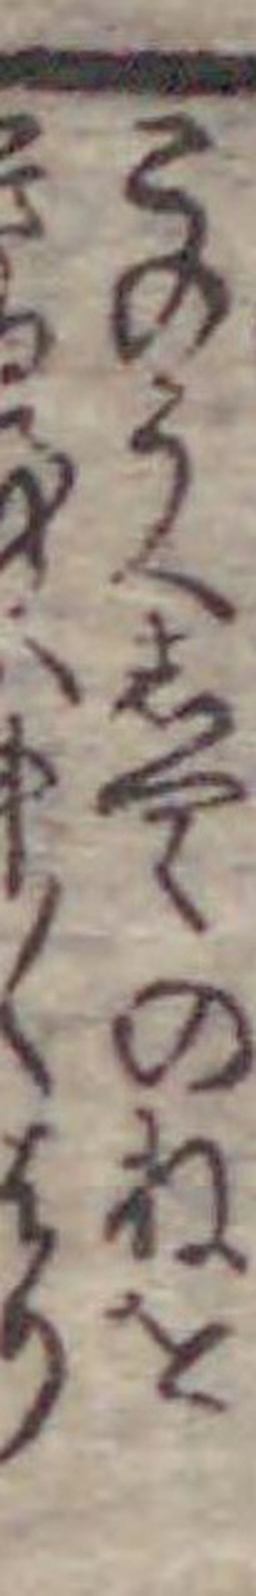きる事は中〳〵はり
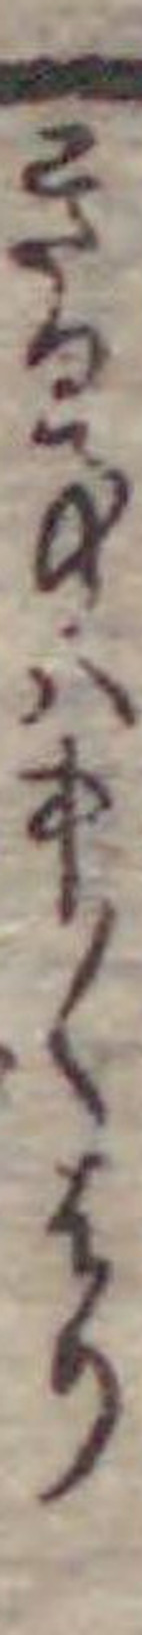きる事は中〳〵はり
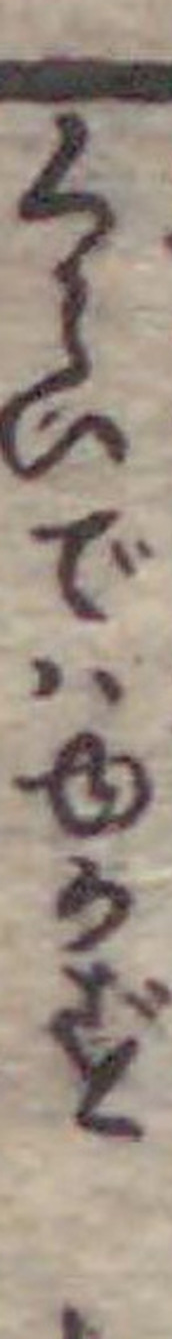くらいではゆかず
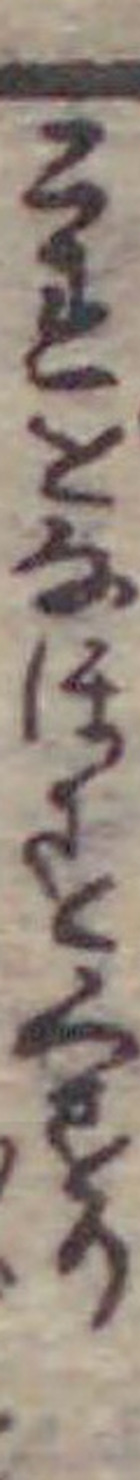これをなほすくすり
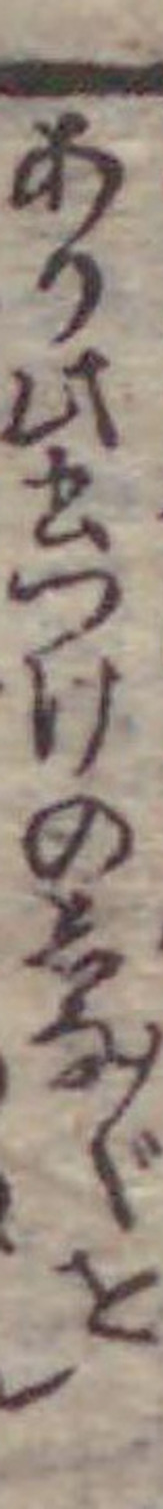あり此出つけのしな〴〵を
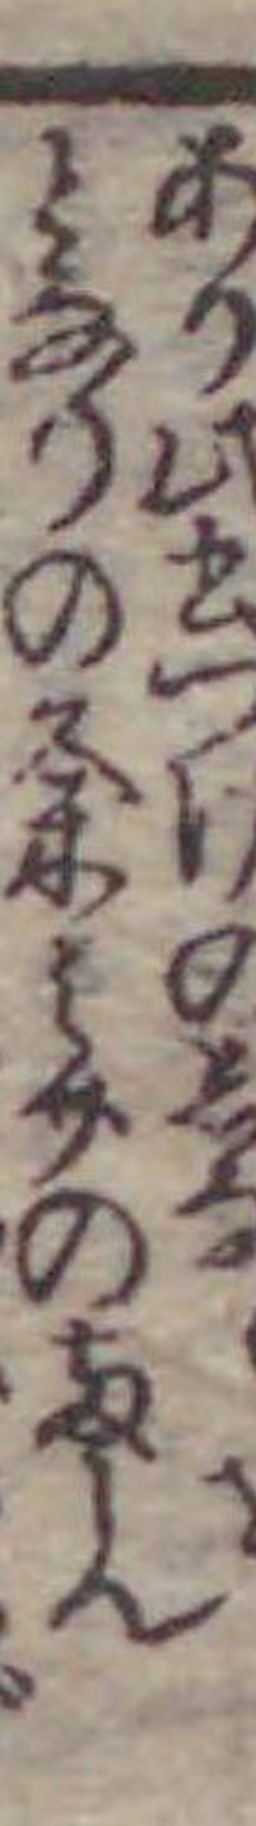となりの久米之介の両しん
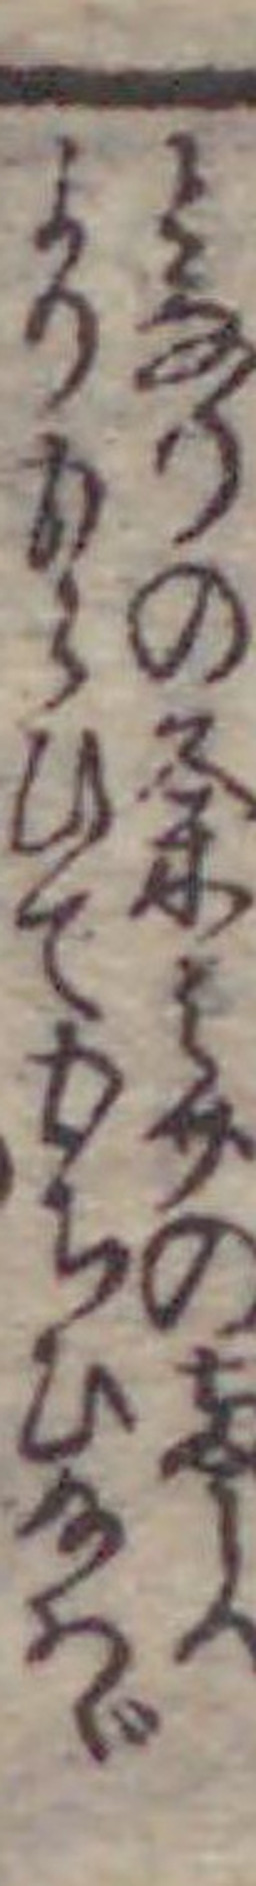よりもらひてもちひなはゞ
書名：鼻下長生薬 : 3巻
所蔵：国立国会図書館 National Diet Library, JAPAN
